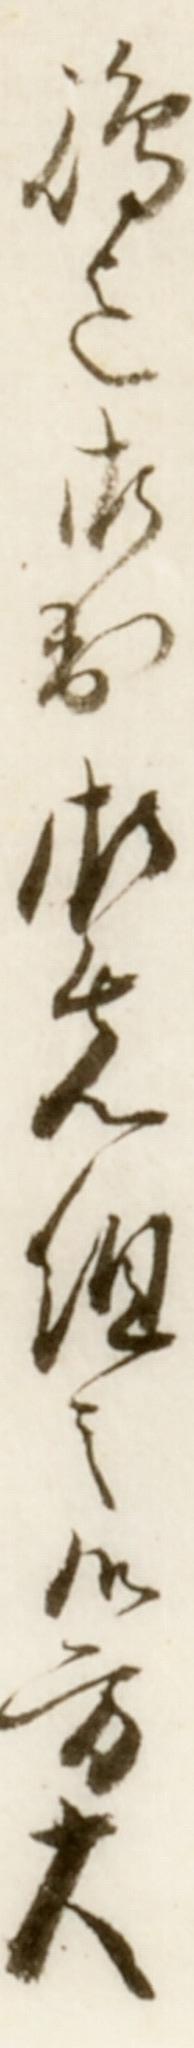嶋迄御出御先組之御方大
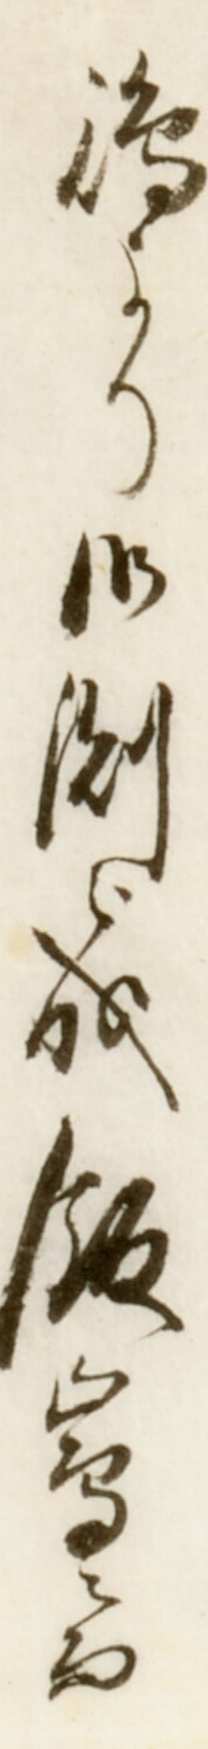嶋より御測被成飯嶋ニ而
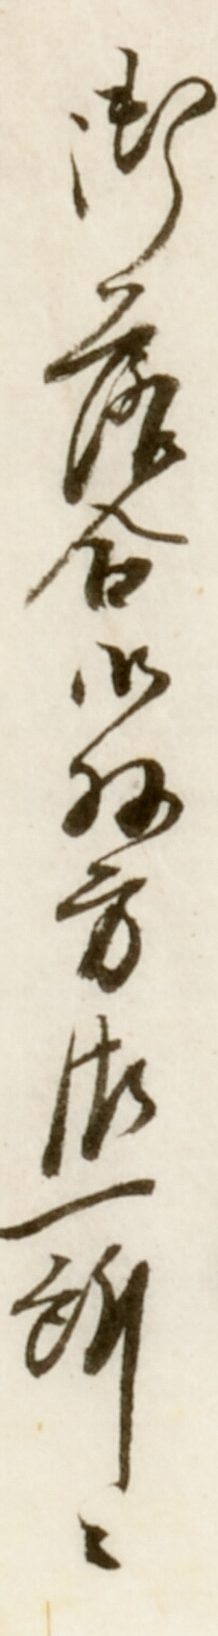御落合御双方御一所ニ
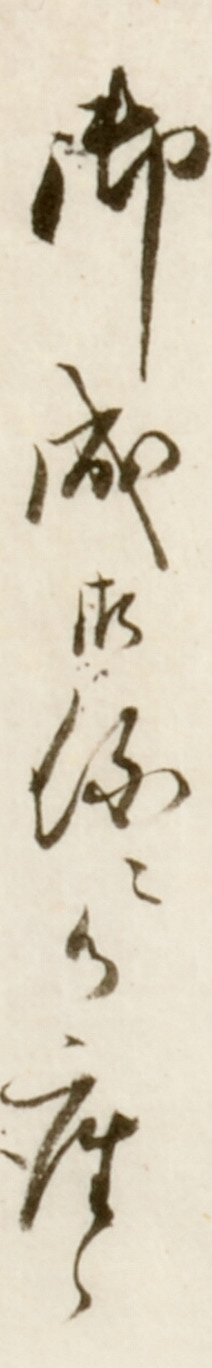御成御泊ニ御座候
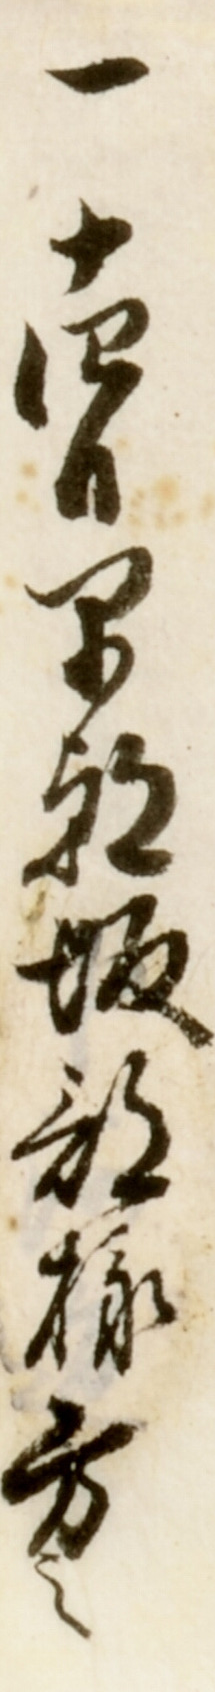一十四日早朝坂部様方之
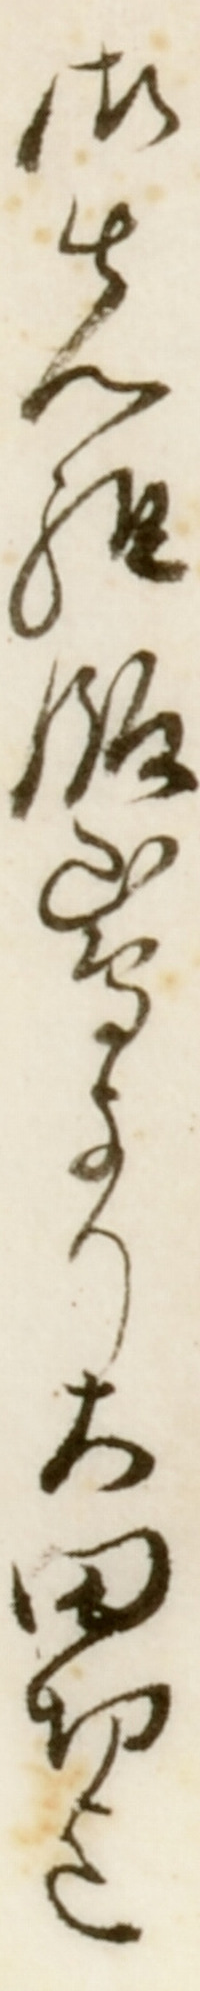御先組飯島より大田切迄
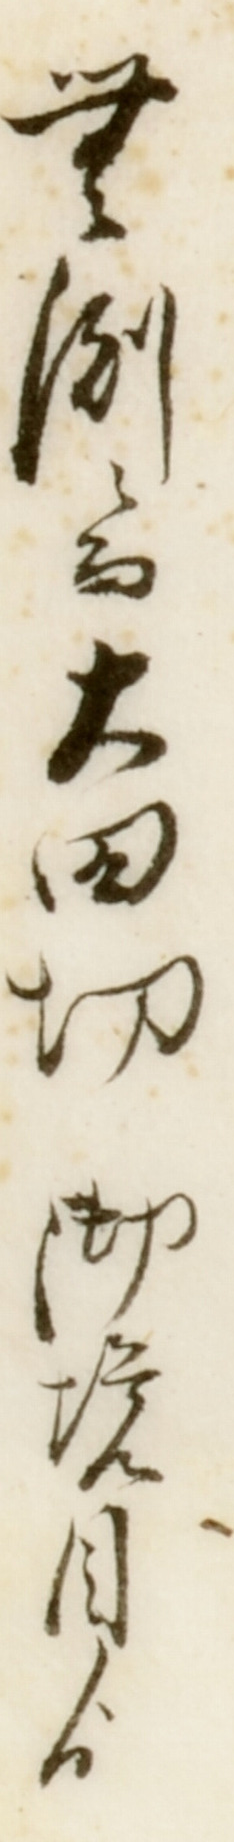無測ニ而大田切御境目より

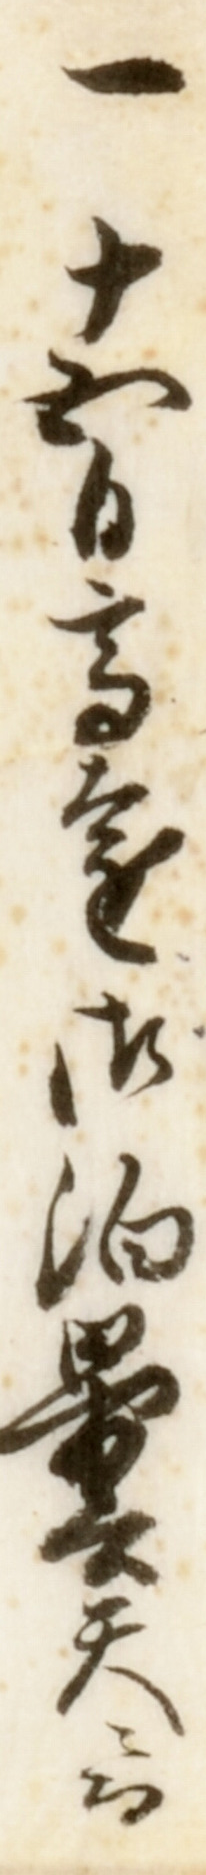一十五日高遠御泊曇天ニ而
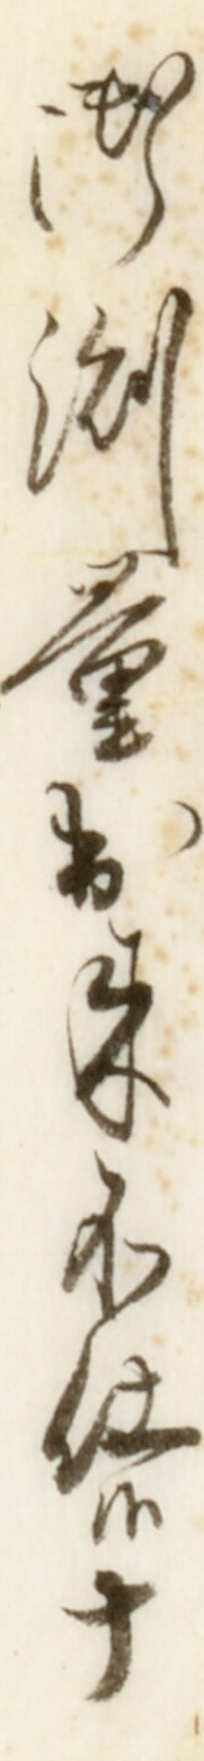御測量出来不仕候十
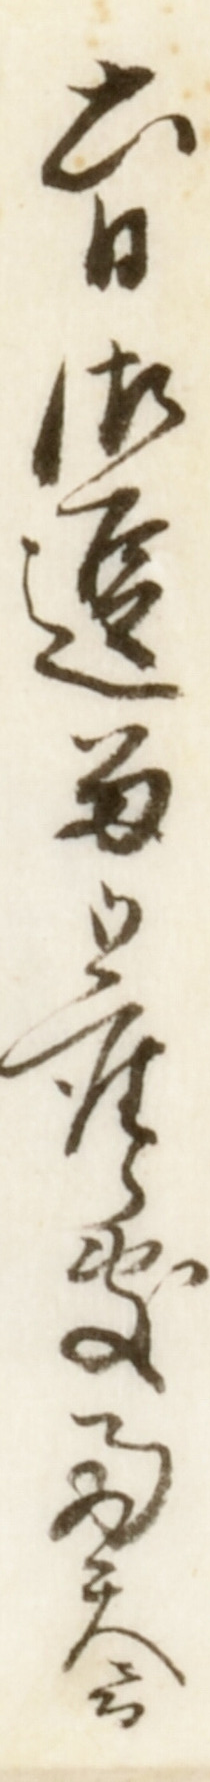六日御逗留御座候處雨天ニ而
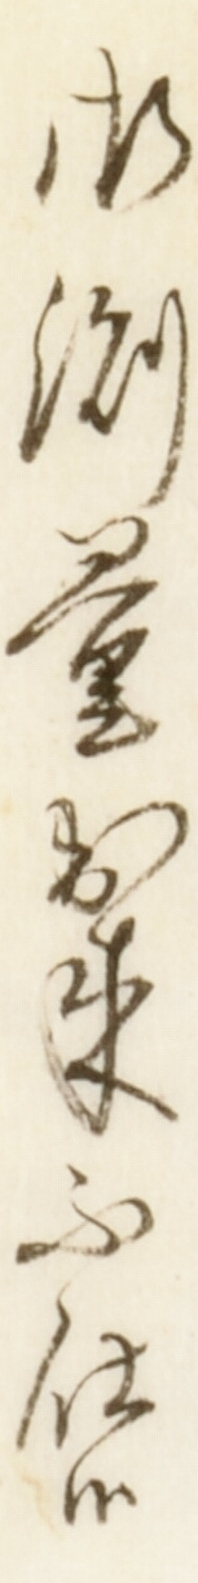御測量出来不仕候
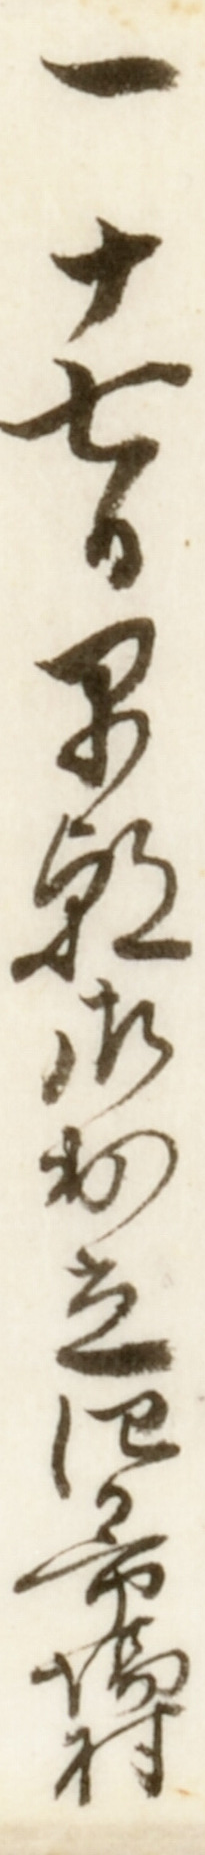一十七日早朝御出立地四日市場村
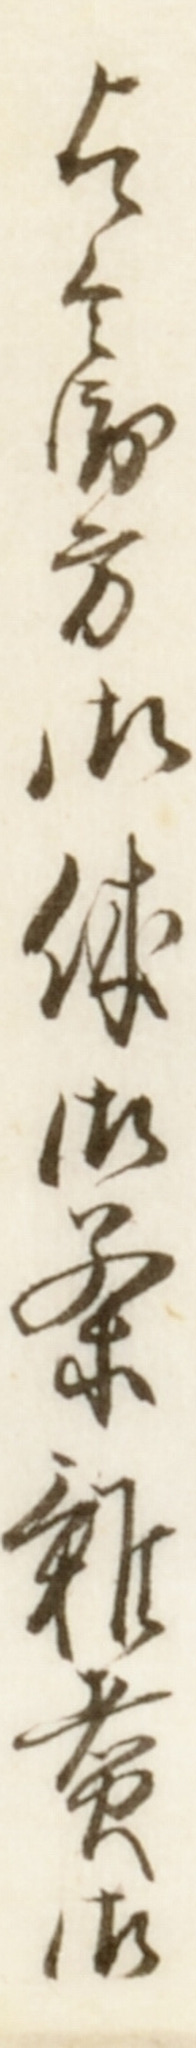与兵衛方御休御茶雑煮御
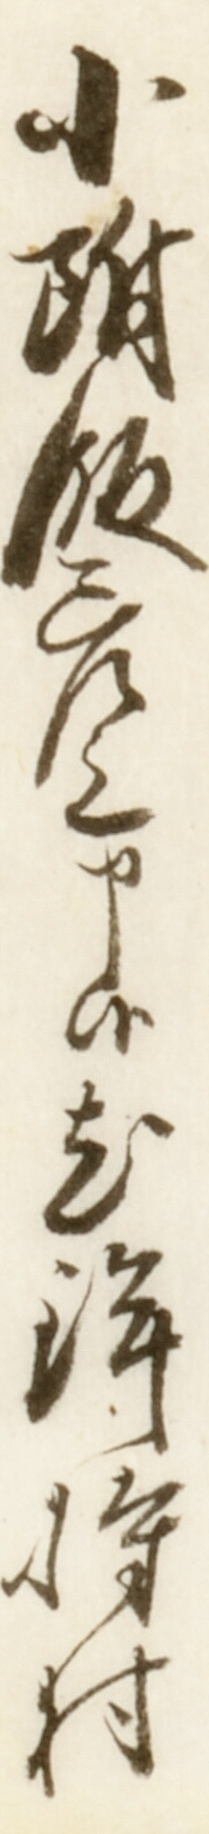小附飯差上申候尤鉾持村
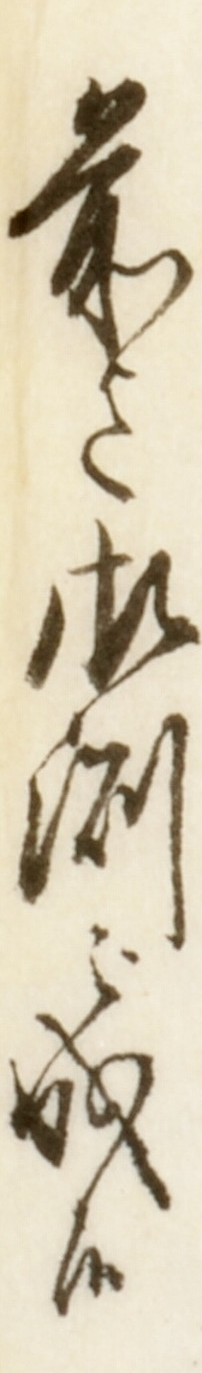前迄御測被成候
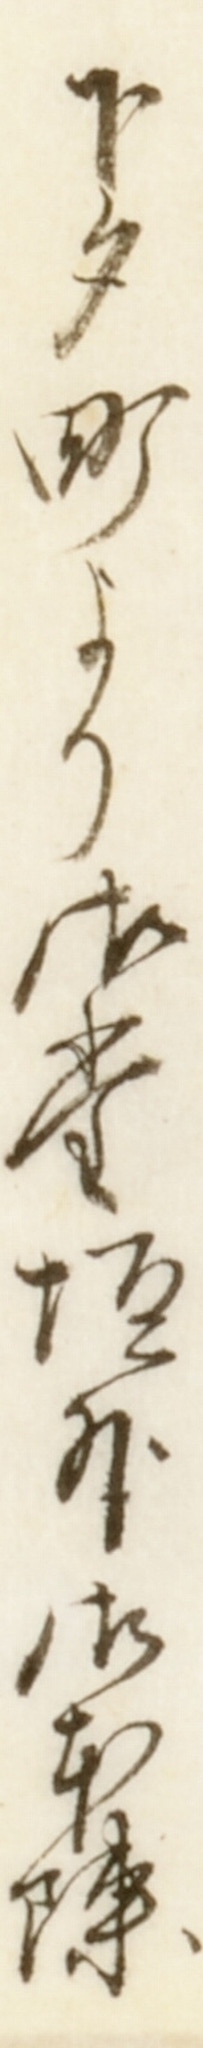下タ町より御堂垣外御本陣
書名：諸事書上
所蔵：伊那市立高遠町図書館・合同会社AMANE
